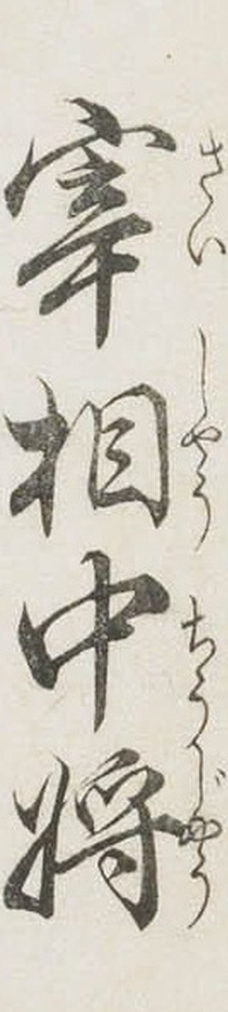宰相中将
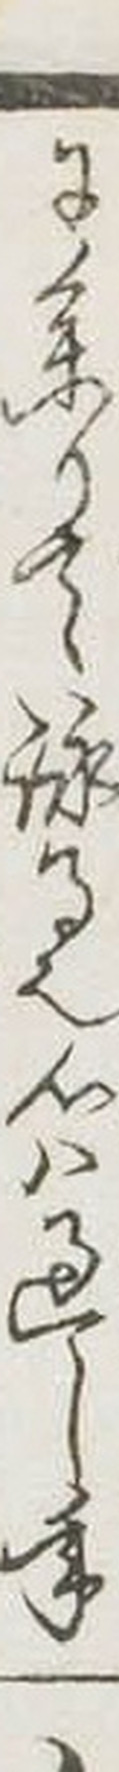に参りて詠る也心は過し年
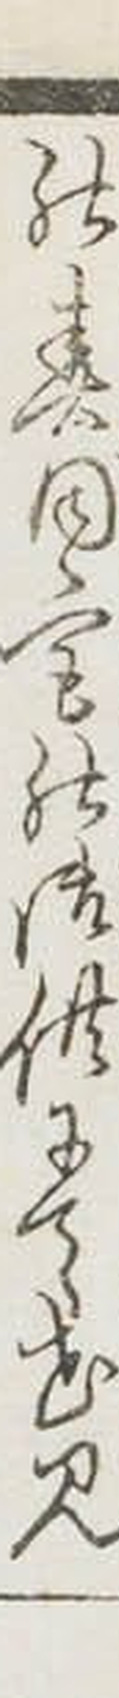の春同宮の御供にて花見
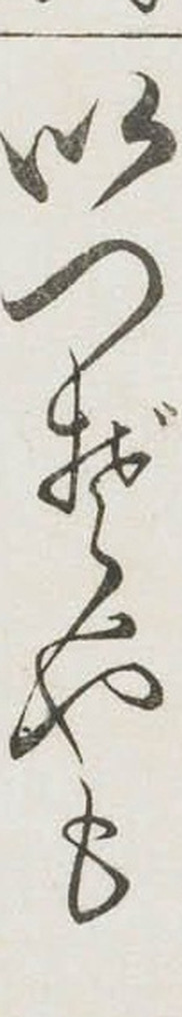いつぞやも
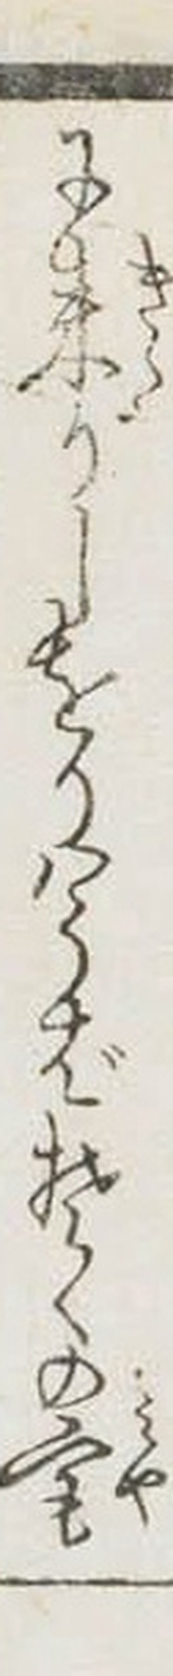に来りしをりはうばそくの宮
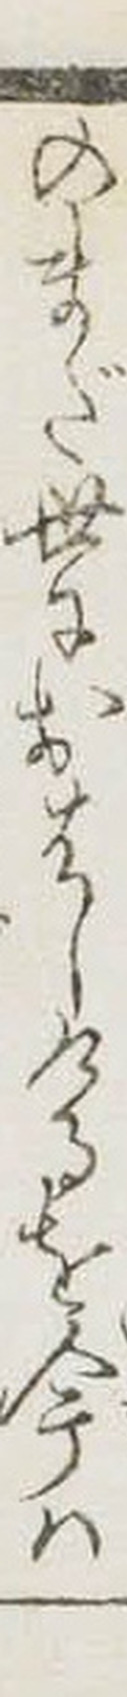のまだ世におはしけるを今は
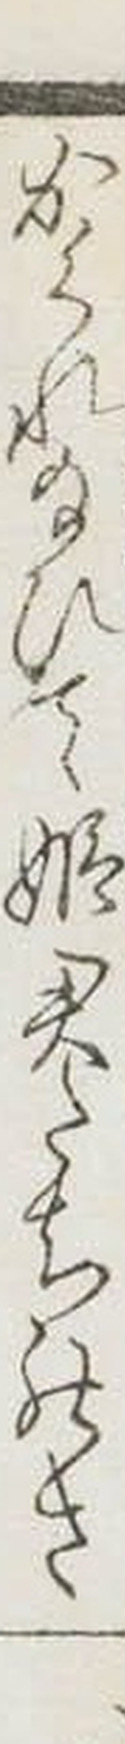かくれ給ひて姫君たちのさ
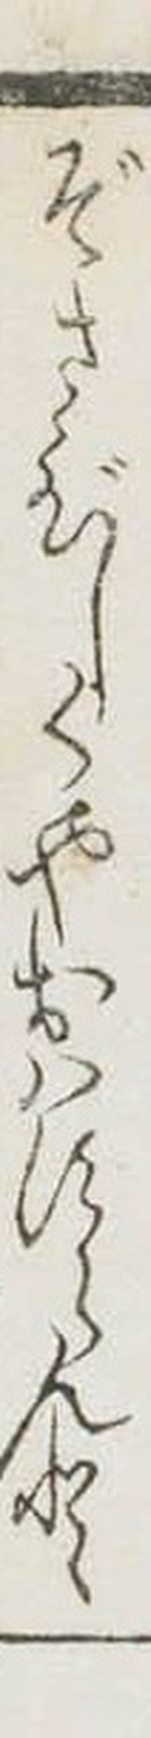ぞさびしくやおはすらんと
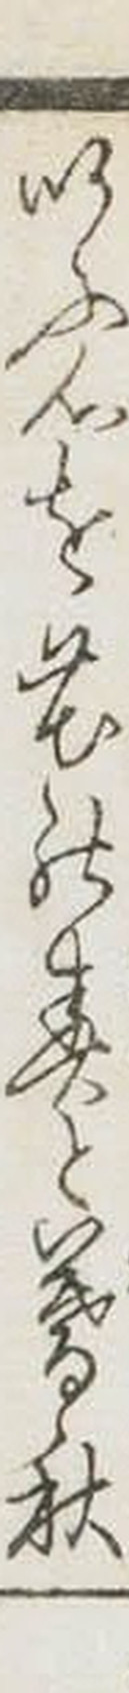いふ心を花の春と暮秋
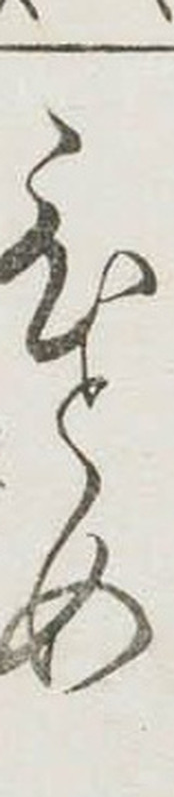ひとめ
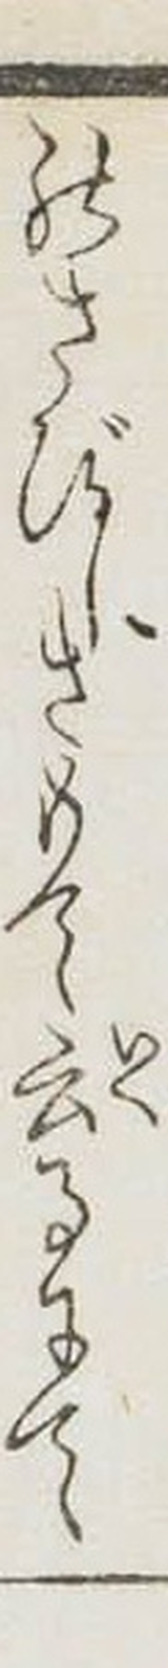のさびしさもて云るにて
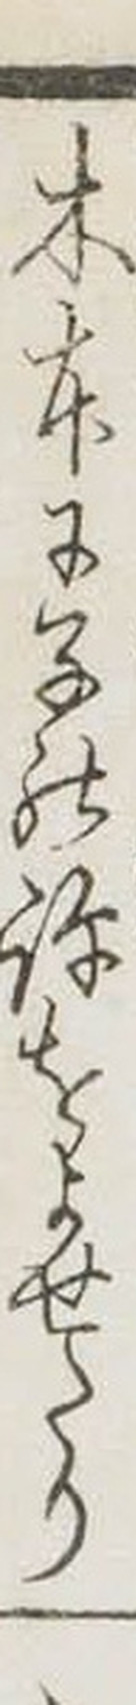木本に子の許をよせたり
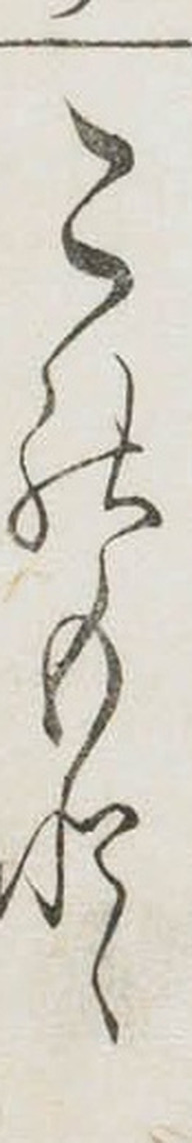このもと
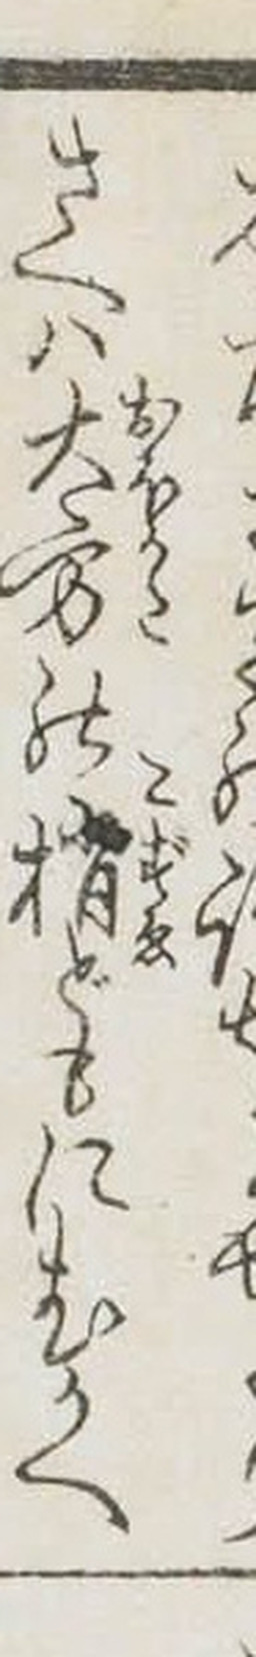さへは大方の梢どもにむかへ
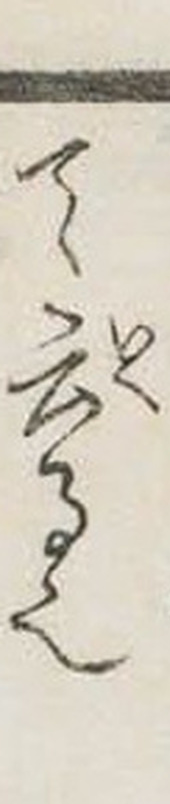て云る也
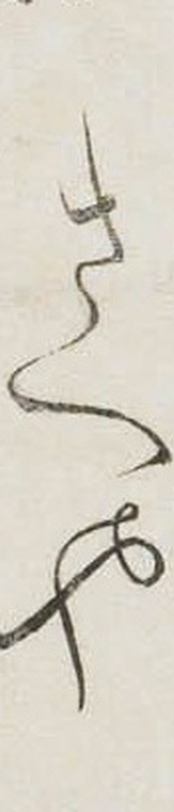さへや
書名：源氏百人一首
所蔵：東京学芸大学教育コンテンツアーカイブ
